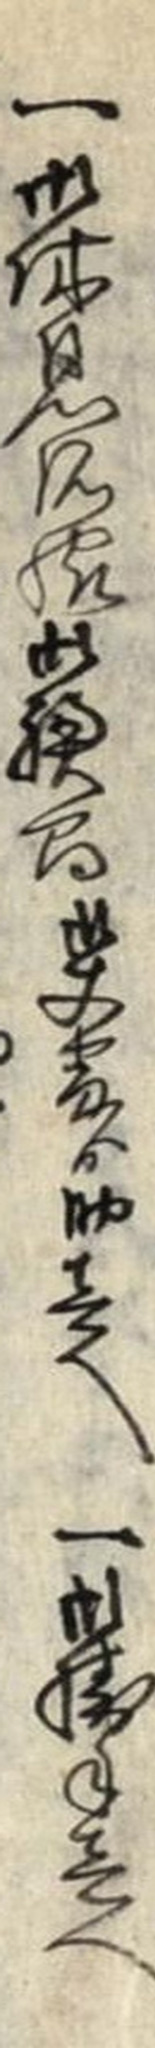一御休息所脇御襖間御使番ゟ助壱人一御勝手壱人
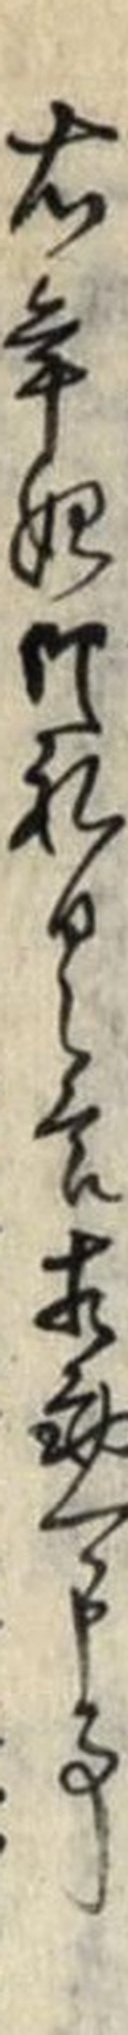右年始御礼日之節相可勤事
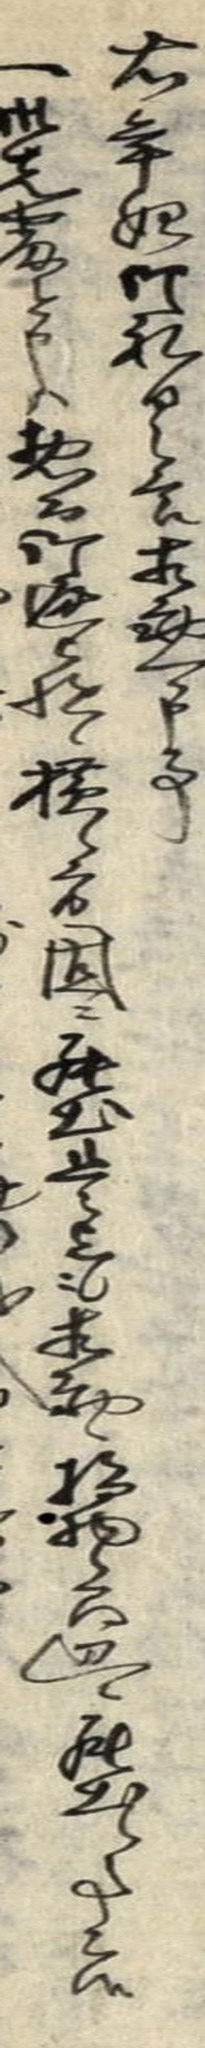一御先番と申は惣而御通被遊候横之方固に罷出是迄も相勤候指物之間辺に罷出候事に候
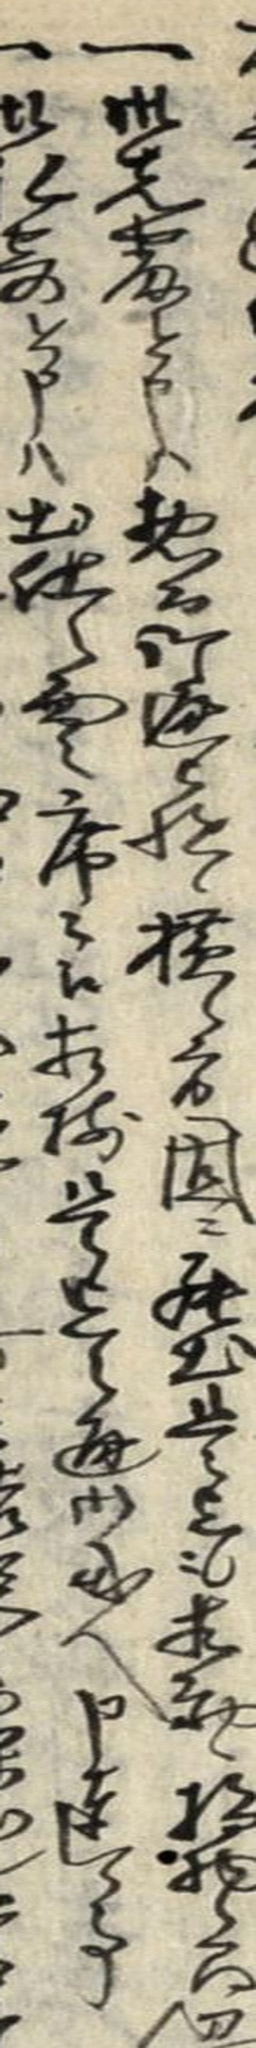一御礼寄と申は出仕之面々席々江相揃是迄之通御用人申達候事
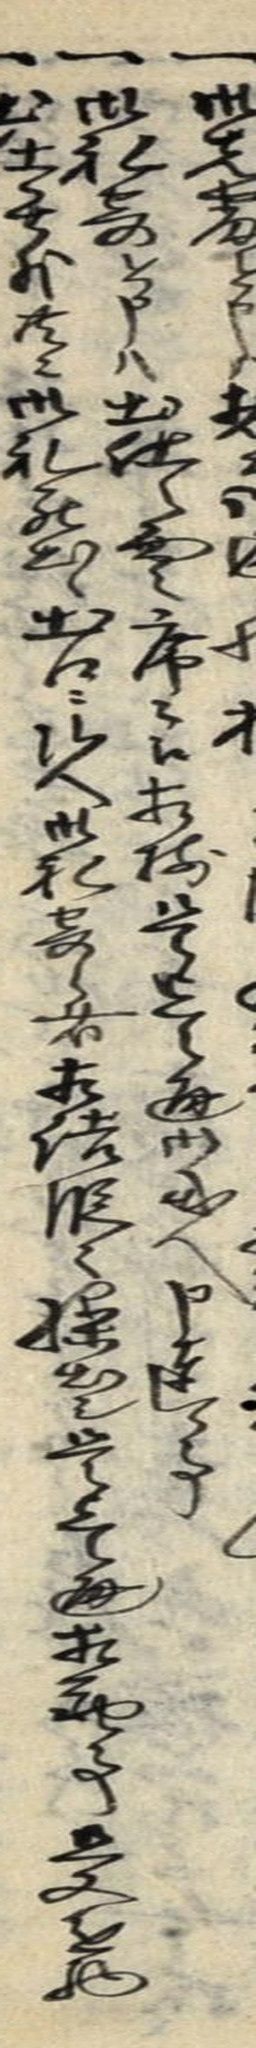一出仕其外共に御礼罷出候出口に弐人御礼寄之者相詰段々繰出し是迄之通相勤候事且又進物
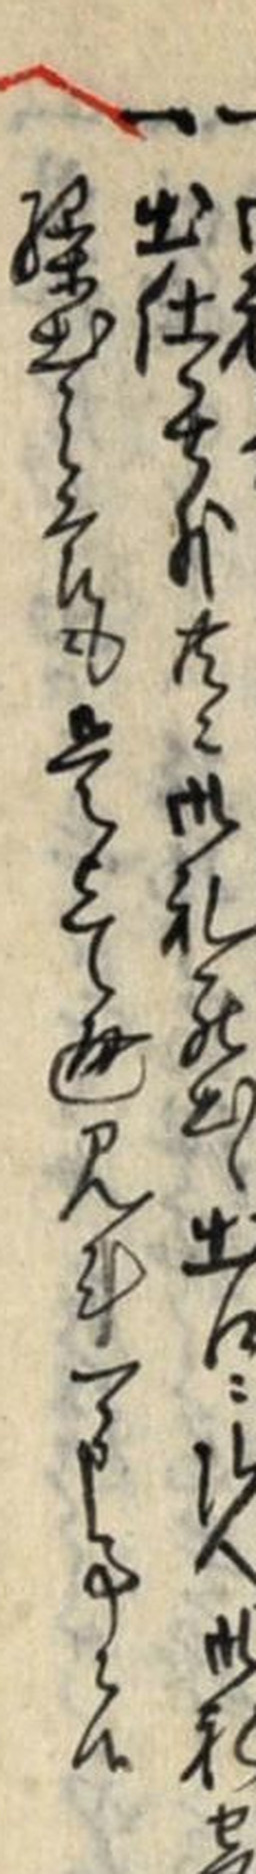繰出候節も是迄之通見斗可申事に候

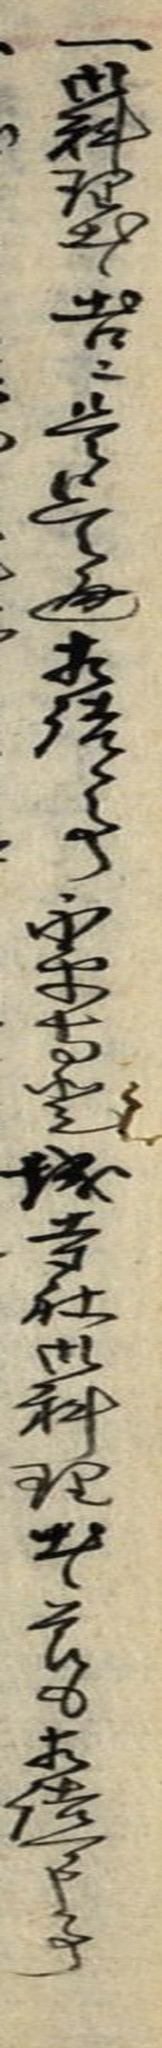一御料理出候出口に是迄之通相詰候事永平寺登城寺社御料理出候節も相詰可申事
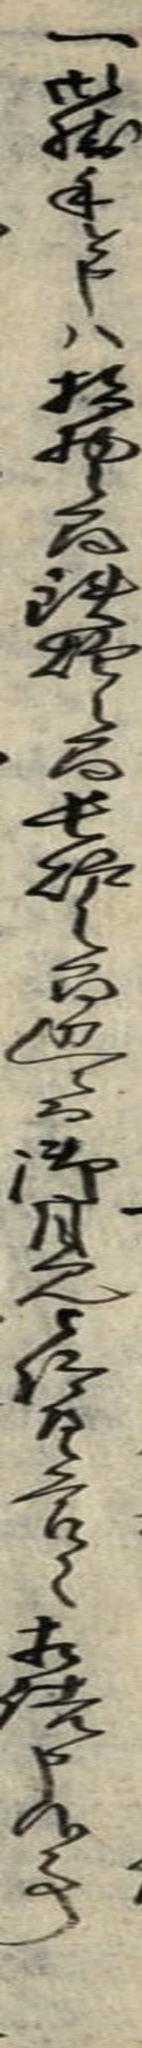一御勝手と申は指物之間鉄砲之間長炉之間辺に而御目見被仰付候節之相詰申候事
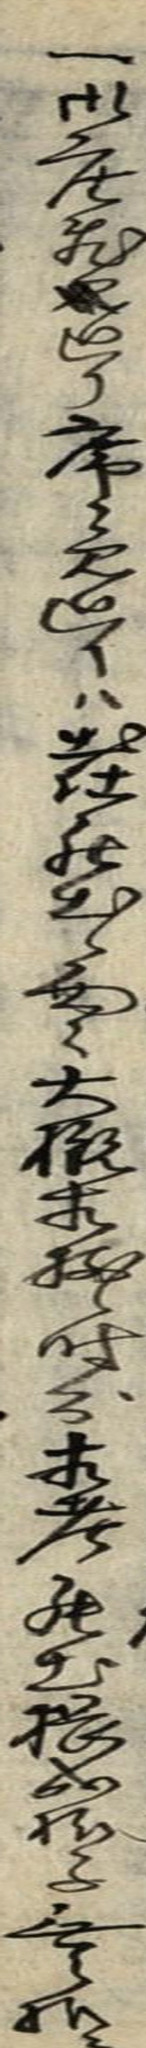一御座敷廻り席々見廻りは出仕罷出候面々大概相揃候時分相考罷出猥成様子無之様に
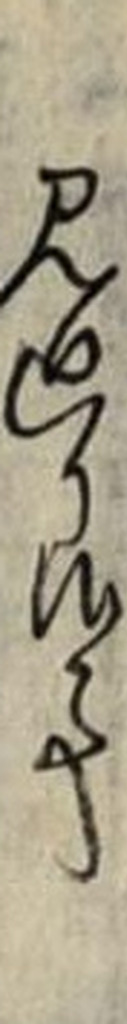見廻り候事
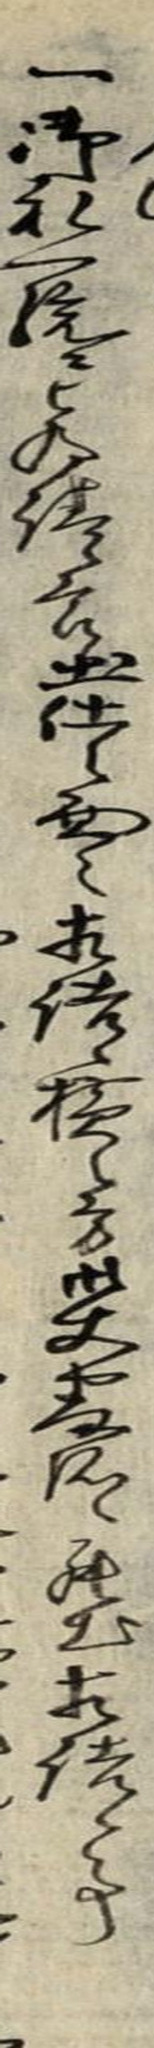一御礼一統に被為請候節出仕之面々相詰候横之方御使番所へ罷出相詰候事
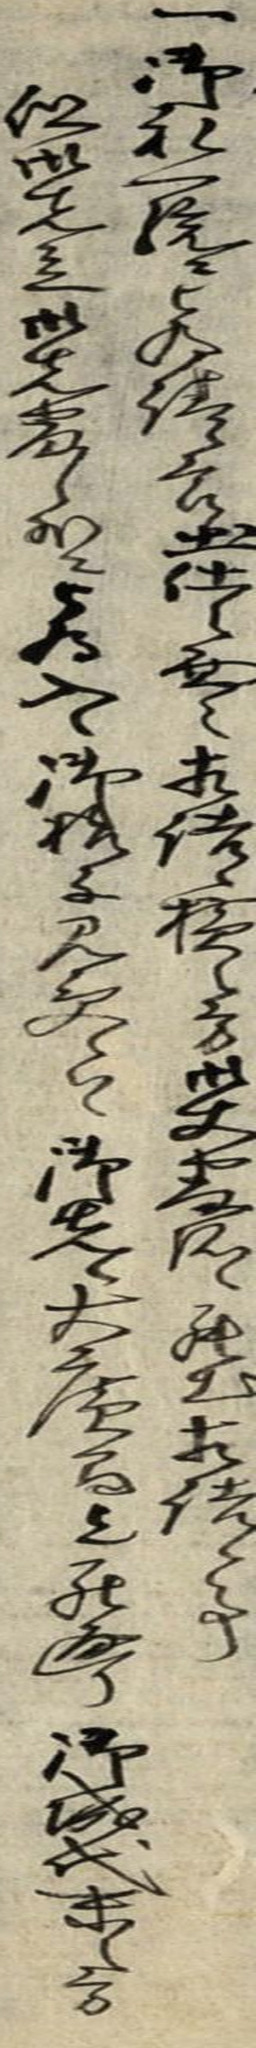但御先立御先番之外に被為入候御様子見受候はゝ御先へ大広間迄罷通り御城代末之方
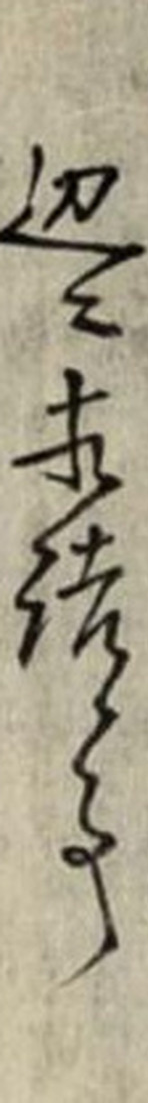辺に相詰候事
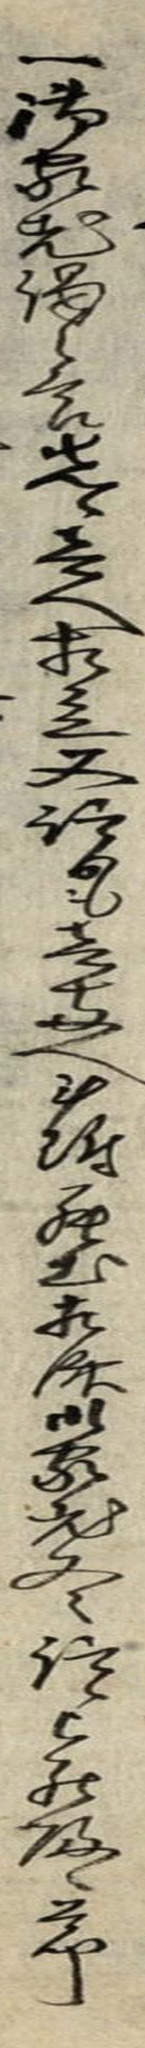一御家老謁之節先へ壱人相立又跡ゟも壱両人斗附罷出相済御家老又々跡へ被罷帰候節
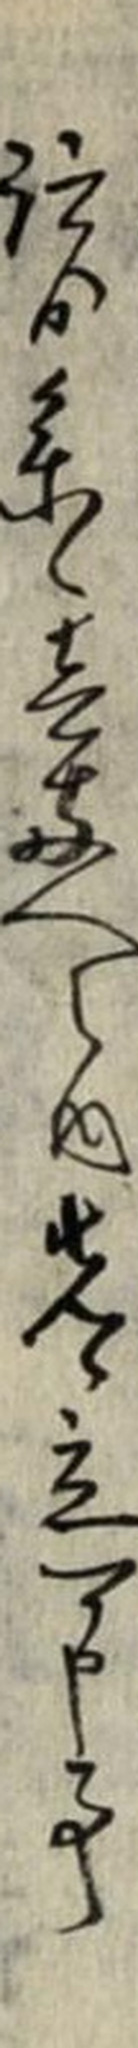跡ゟ参候壱両人之内先に立可申事
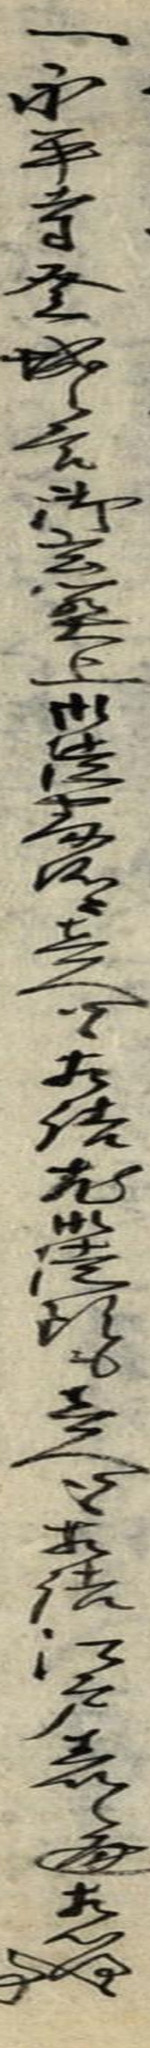一永平寺登城之節御玄関上御徒番所に壱人つゝ相詰尤御徒頭も壱人つゝ相詰江戸表之通相心得候事
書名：蒐輯之部
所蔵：福井県文書館 Fukui Prefectural Archives
